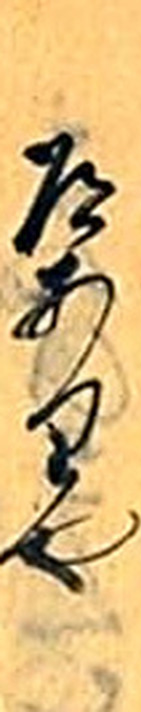道ありや
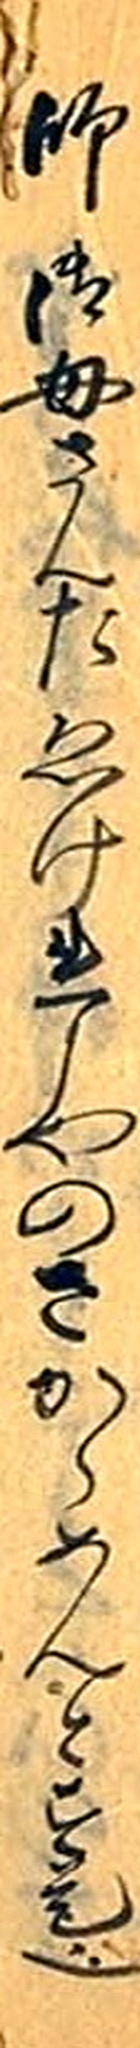師御母さんたゑけれしやのさからめんとす是也
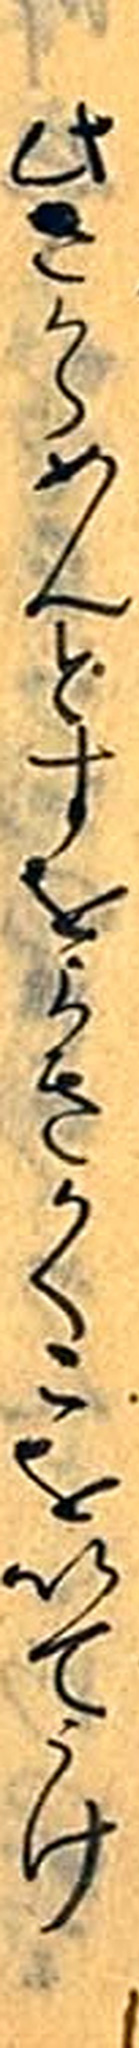此さからめんとすをよきかくこを以てうけ
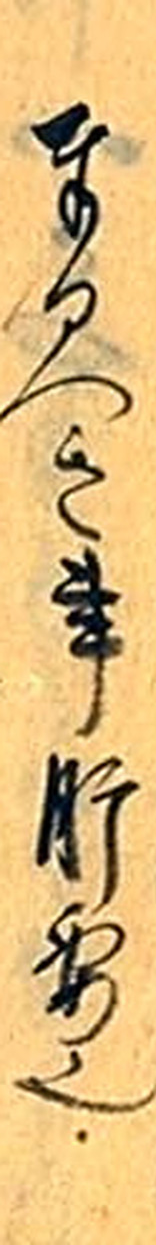奉るへき事肝要也
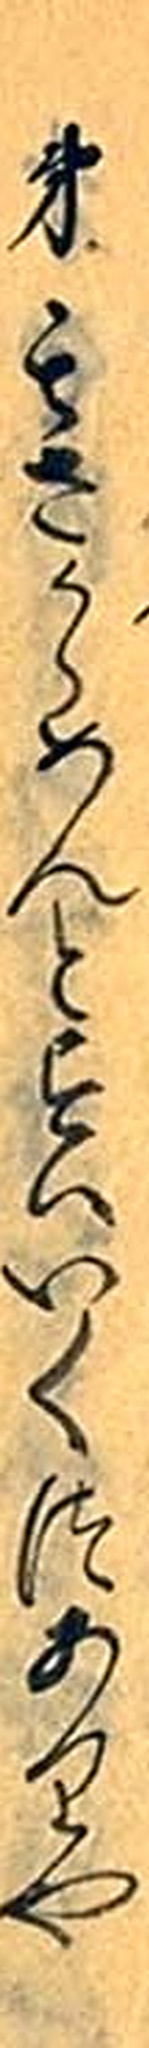弟其さからめんとすはいくつありや
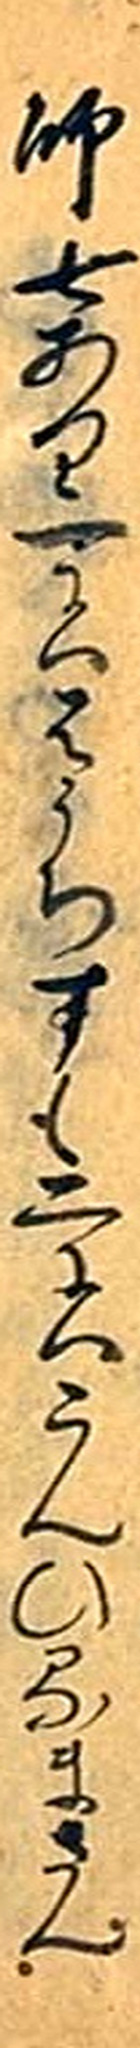師七あり一にははうちすも二にはこんひるまさん
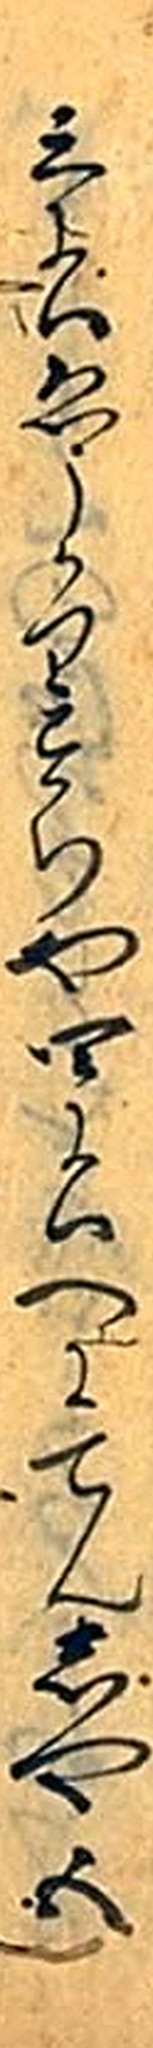三にはゑうかりすちや四にはへにてんしや五
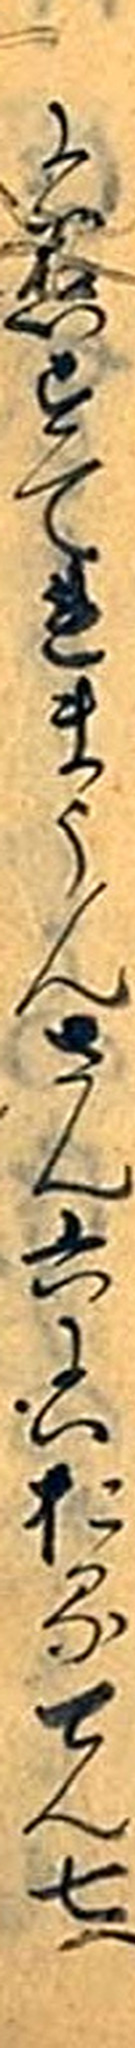にはゑすてれまうんさん六にはおるてん七
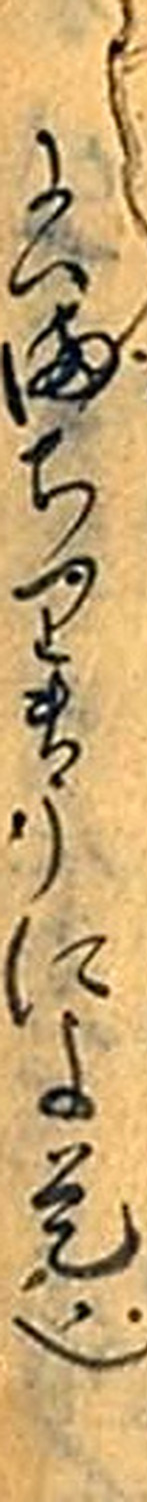にはまちりまうによ是也

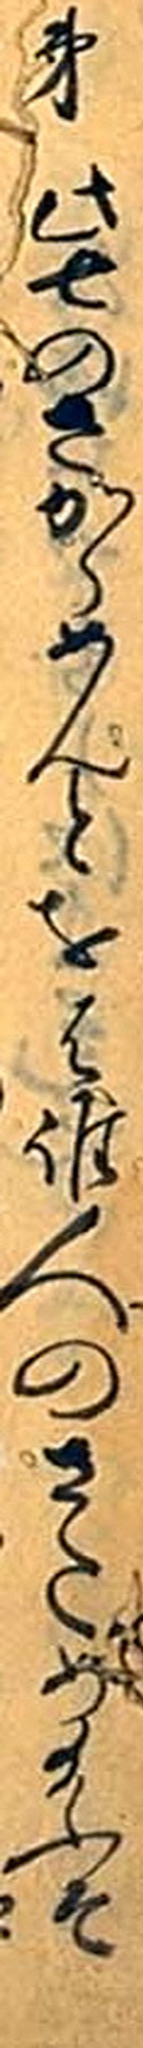弟此七のさからめんとをは誰人のさため給ふそ
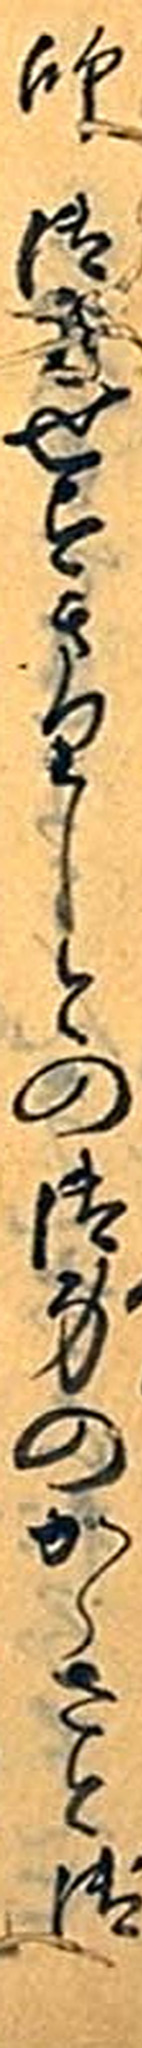師御主せすきりしとの御身のからさと御
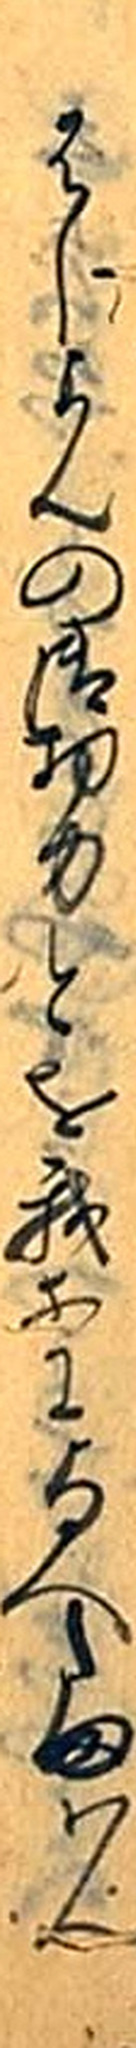はしよんの御功力とを我等に与へたまはん
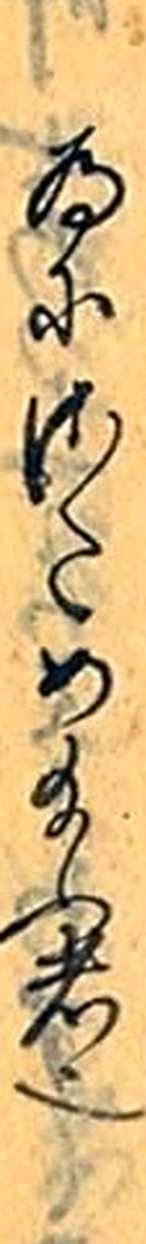為にさため給ふ者也
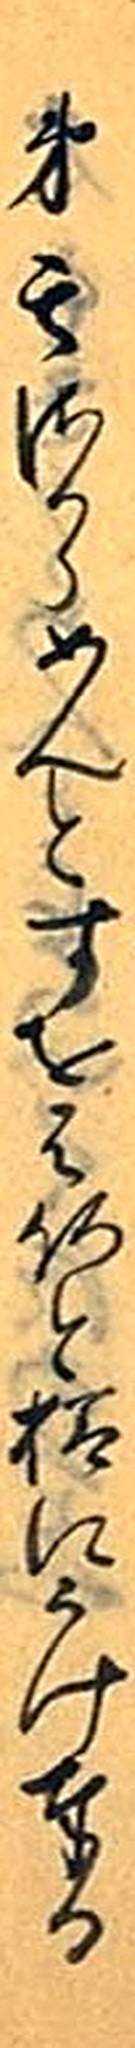弟其さからめんとすをは何と様にうけ奉る
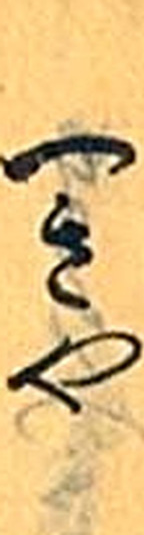へきや
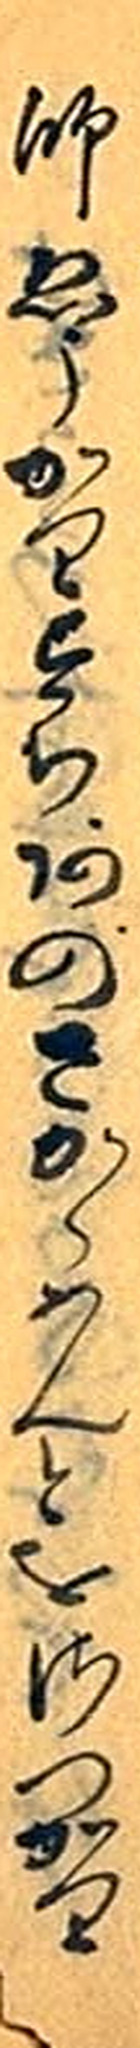師ゑうかりすちあのさからめんとをさつかり
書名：ドチリナ・キリシタン
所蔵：東京大学総合図書館 / General Library in the University of Tokyo
